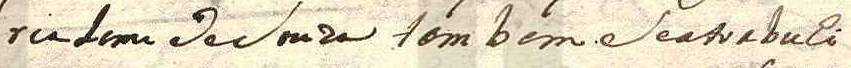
ria Leme de souza tambem se atrabuhi
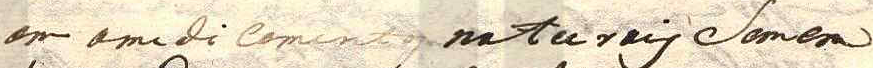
am a medicamentos naturais sem em
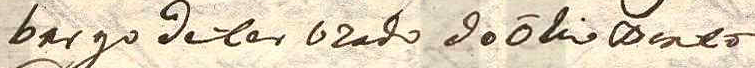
bargo de ter uzado do ólio Bento
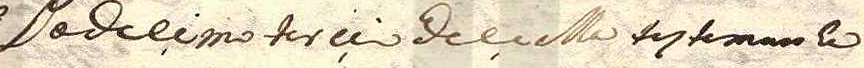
Do deçimotercio diçe ella testemunha
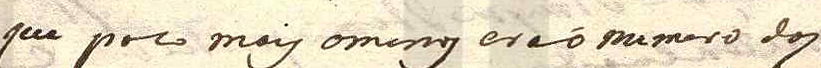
que poco mais o menos eraõ numero dos
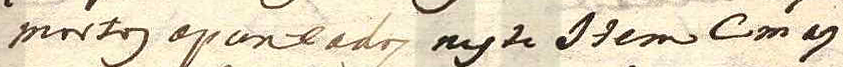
mortos apuntados neste Item com as
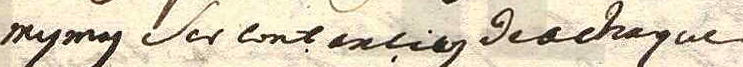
mesmas sercontançias de achaque
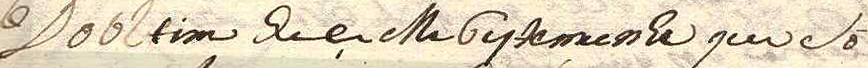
Do ultimo diçe ella Testemunha que só
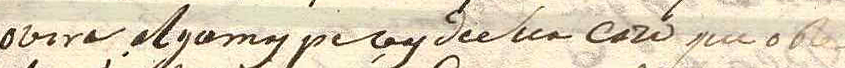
ovira algumas peçoas de sua caza que o Re
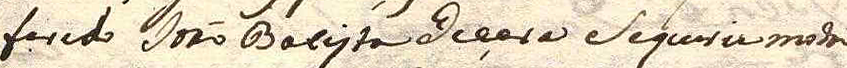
ferido Ioão Batista deçera se queria modar
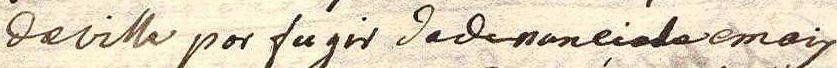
da villa por fugir da denunçiada e mais
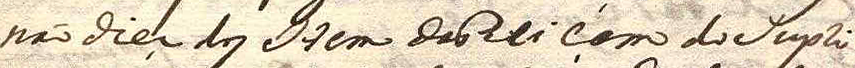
naõ diçe dos Item da Petiçam do supli
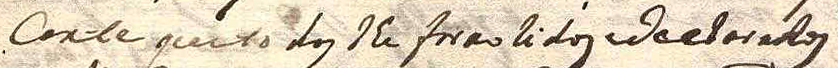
cante que todos lhe forao lidos e declarados
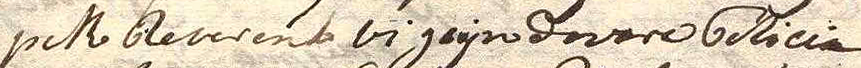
pello Reverendo vigayro da vara Feliçia
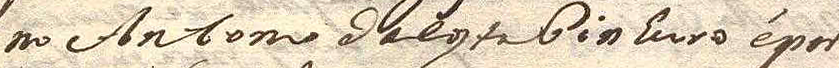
no Antonio da costa Pinheiro e por
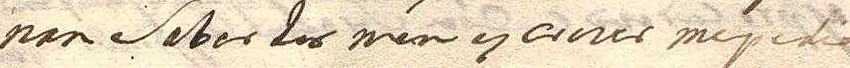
nan saber ler nem escrever me pedio
